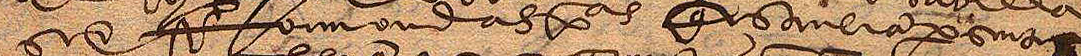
se ēfformou das pas q̄ estiuerā ꝑsentes
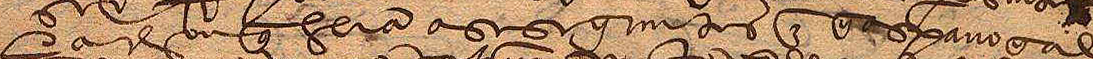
e achou q̄ herā as segimtes item gaspa uogado
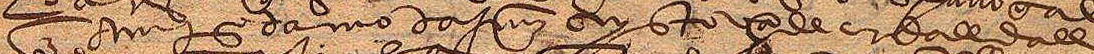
item Amto da mota Juiz crystovā de cidade dall
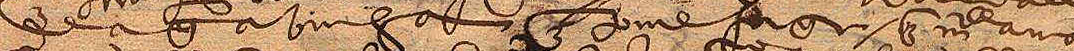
dea gavinha item tome Jorge / item mell ama
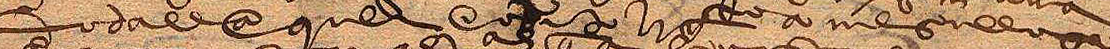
do dallāquer e o dito vigro comesou llogo
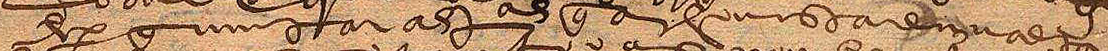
de ꝑgumtar as tas q̄ achou estarem na dita
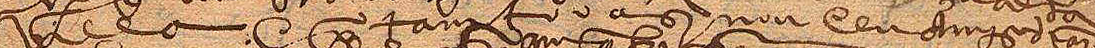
villa e p̄o tamto o asjnou e eu Amto diaz
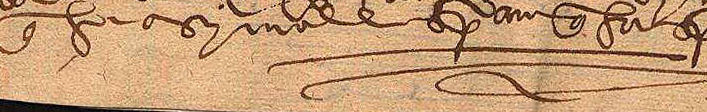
q̄ hora syruo de esp̄vam q̄ ho esp̄
